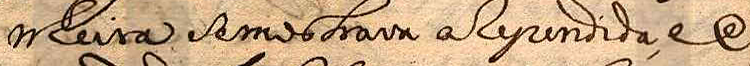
nheira se mostrava aRependida, e e
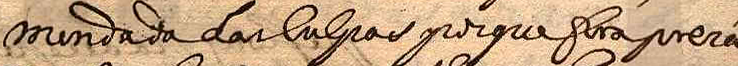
mendada das Culpas porque fora preza?
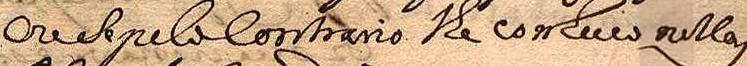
Ou se pelo Contrario lhe conheceo nellas
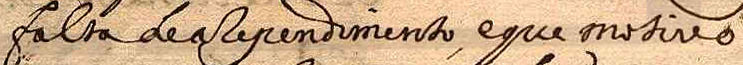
falta de aRependimento, e que motivo
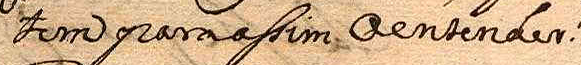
tem para assim o entender?
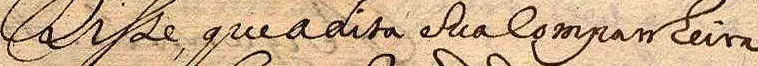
Disse, que a dita Sua Companheira
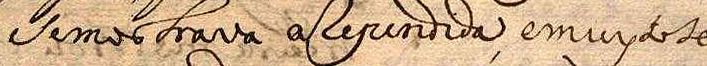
se mostrava aRependida, e muyto te
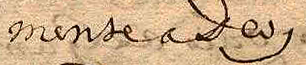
mente a Deos.
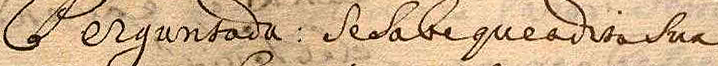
Perguntada: se sabe que a dita sua
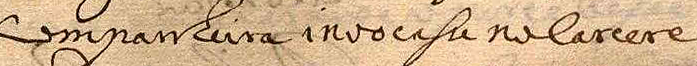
companheira invocasse no carcere
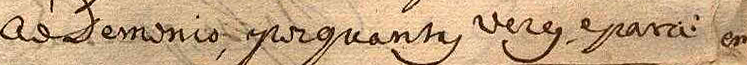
ao Demonio, e por quantas vezes e para: em
